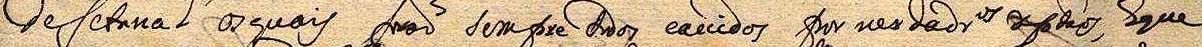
de SetuuaL os quais forão sempre tidos e auidos por uerdadros xptãos, E que
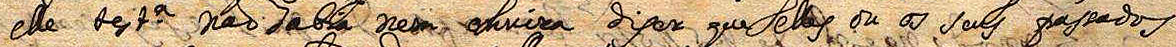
elle test.a não sabia nem ouuira diser que elles ou os seus passados
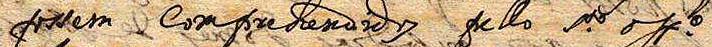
fossem comprehendidos pello s.to off.o
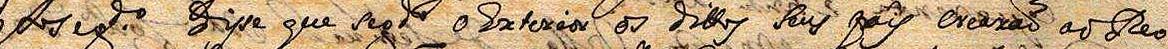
Ao seg.do disse que segdo o Exterior os dittos seus pais crearão ao Reo
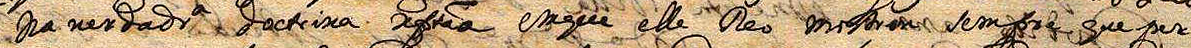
na uerdadra doctrina xptāa em que elle Reo mostrou sempre que per
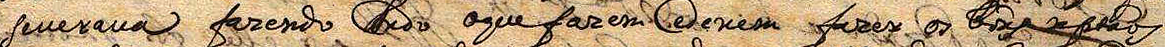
seueraua fazendo tudo o que fazem e deuem fazer os bons xptãos
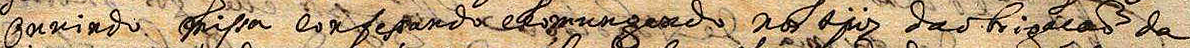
Ouuindo missa confessando e comungando nos tpos da obrigaçaõ da
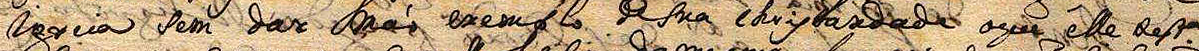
Igreia sem dar máo exemplo de sua christandade o que elle test.a
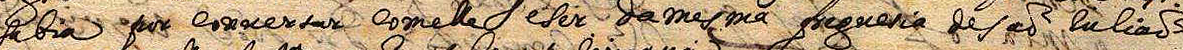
sabia por conuersar com elle e ser da mesma freguesia de saõ Iuliaõ
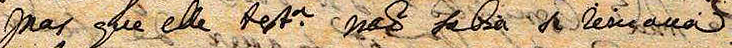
Mas que elle testa. naõ sabia se Ieiuaua
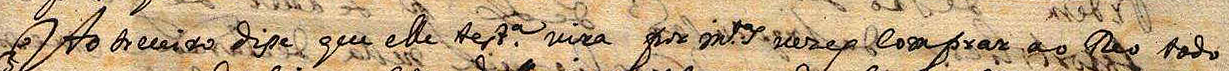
3o Ao terceiro disse que elle test.a uira por m.tas uezes comprar ao Reo todo
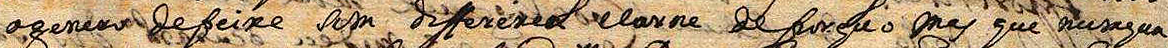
o genero de peixe sem differenca e carne de porquo mas que nunqua
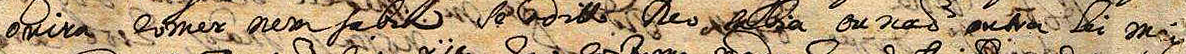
o uira comer nem sabia se o ditto Reo sabia ou naõ outra lei mais
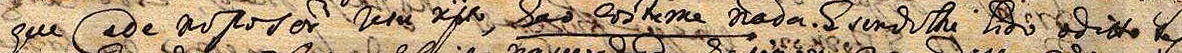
que a de nosso sor̄ Iesu xpto, E ao costume nada. E sendolhe lido o ditto tes
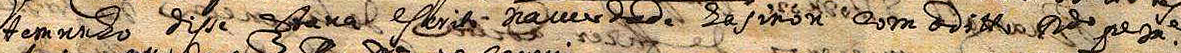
temunho disse estaua escrito na uerdade E asinou com o ditto Rdo pe me.
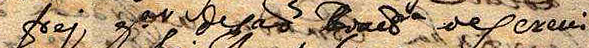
frej g.ar de são Boaura o escreui
